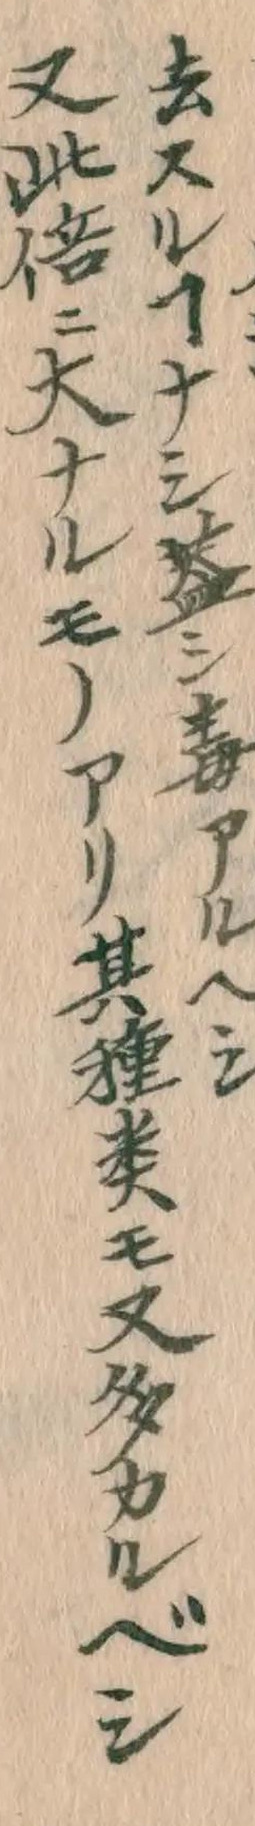又此倍ニ大ナルモノアリ其種类モ又多カルベシ
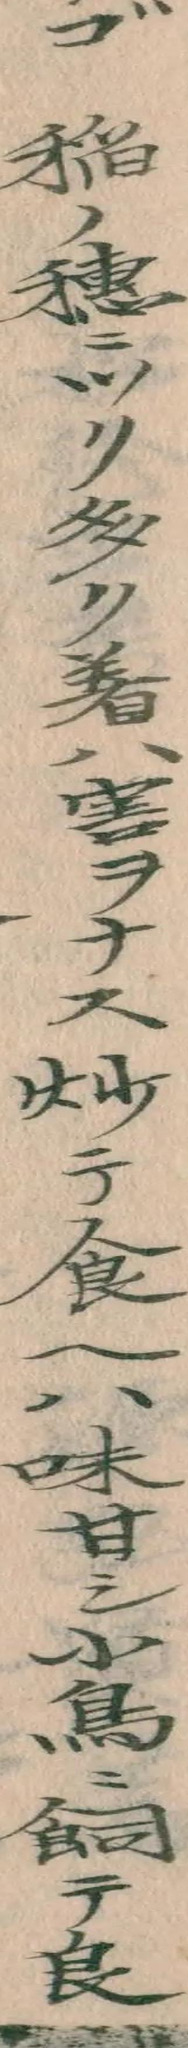イナゴ稲ノ穂ニツク多ク着ハ害ヲナス炒テ食ヘハ味甘シ小鳥ニ飼テ良
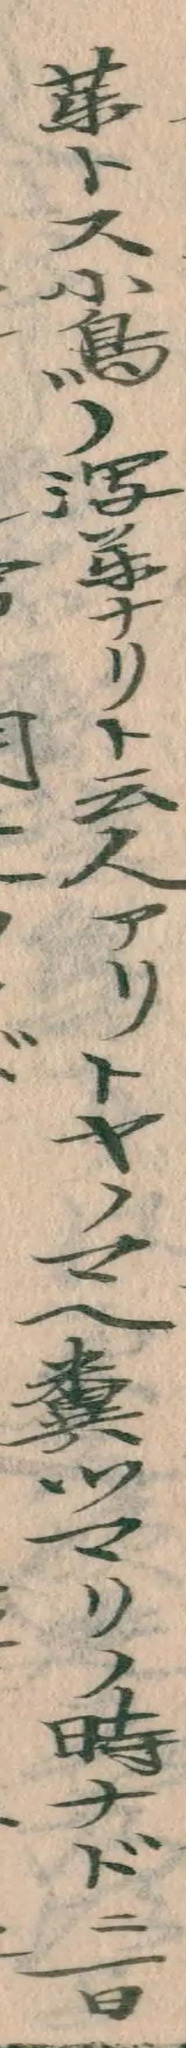薬トス小鳥ノ瀉薬ナリト云人アリトヤノマヘ糞ツマリノ時ナドニ一日
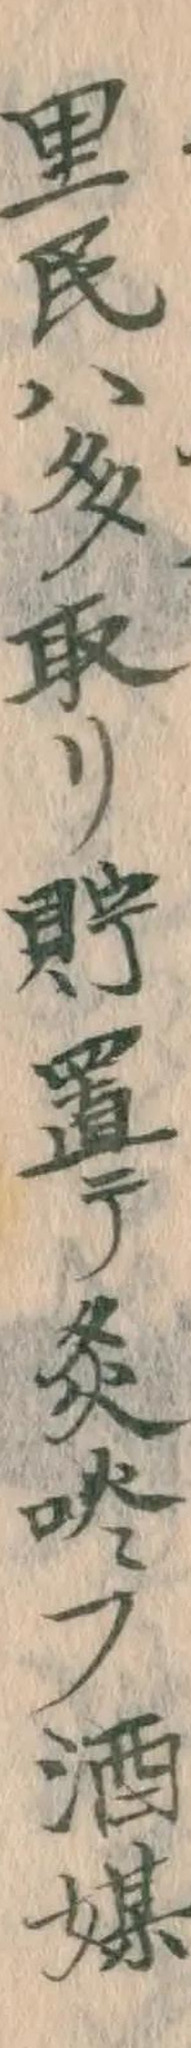里民ハ多取リ貯置テ炙啖フ酒媒
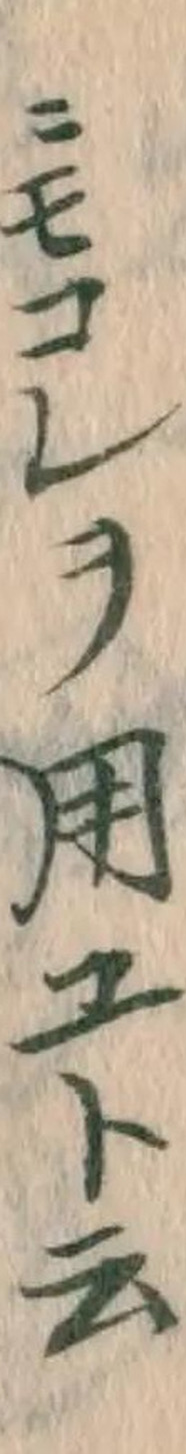ニモコレヲ用ユト云
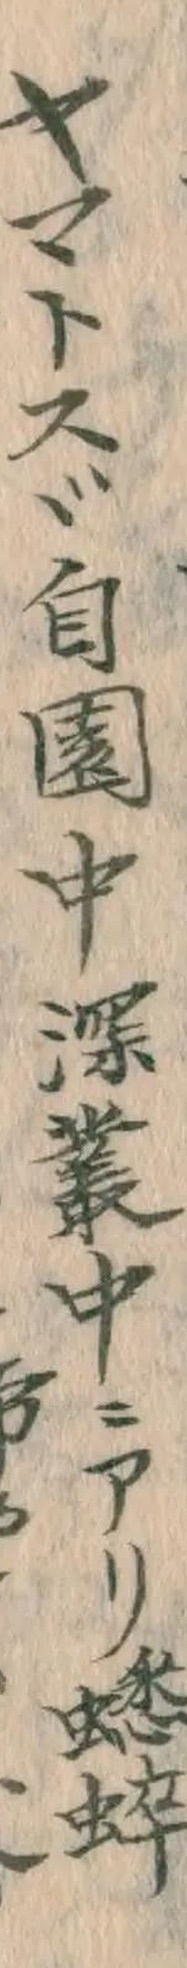ヤマトスヾ自園中深叢中ニアリ蟋蟀
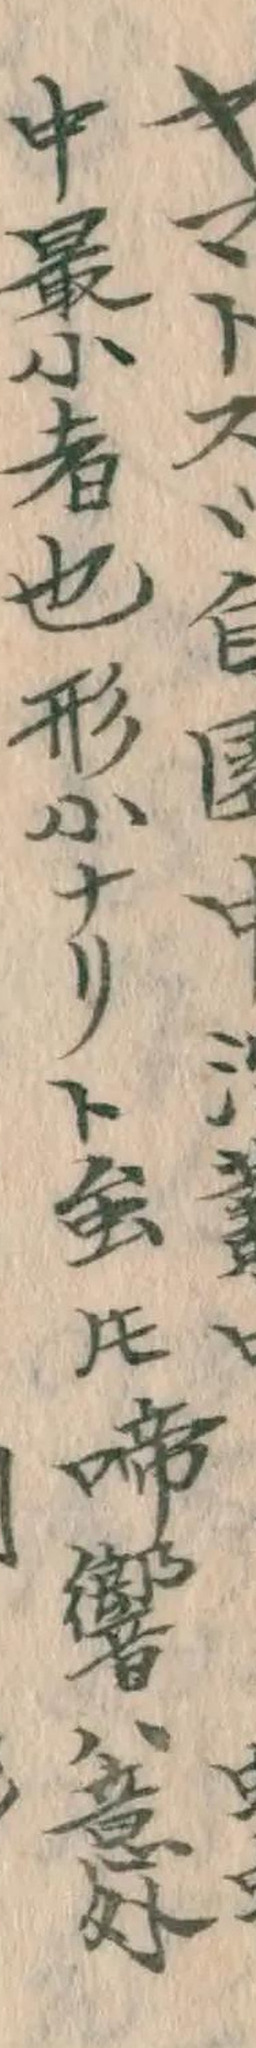中最小者也形小ナリト𧈧トモ啼響ハ意外
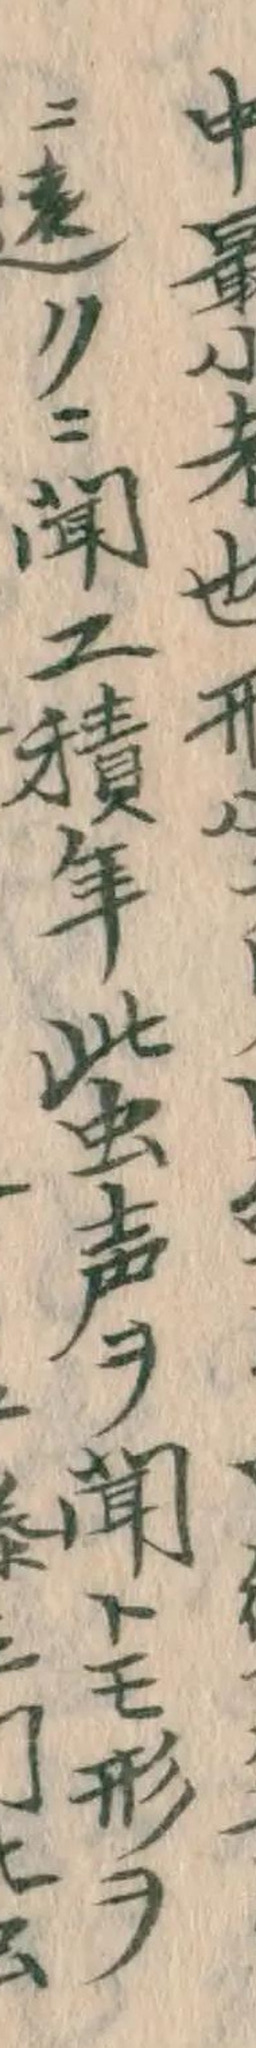ニ遠クニ聞ユ積年此虫声ヲ聞トモ形ヲ
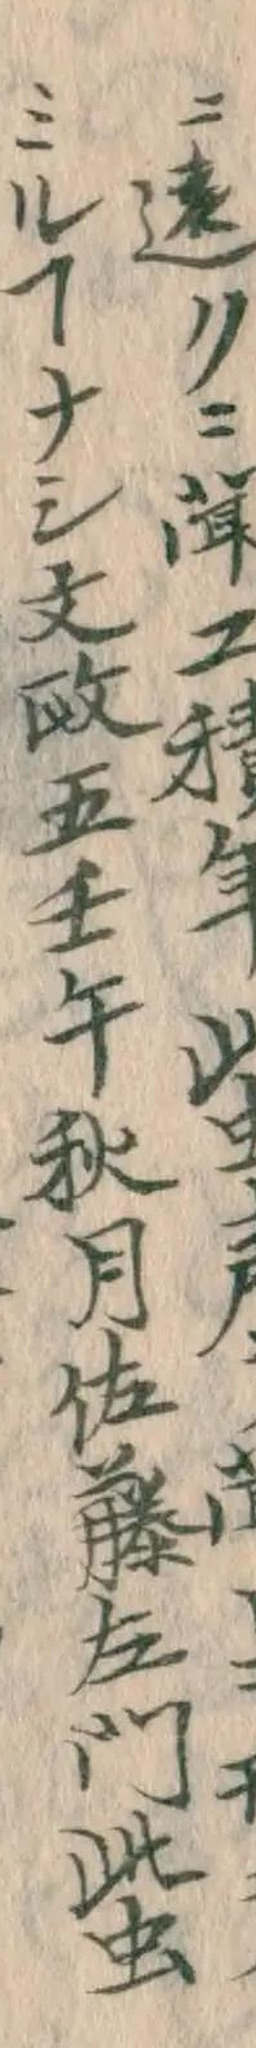ミルコトナシ文政五壬午秋月佐藤左門此虫
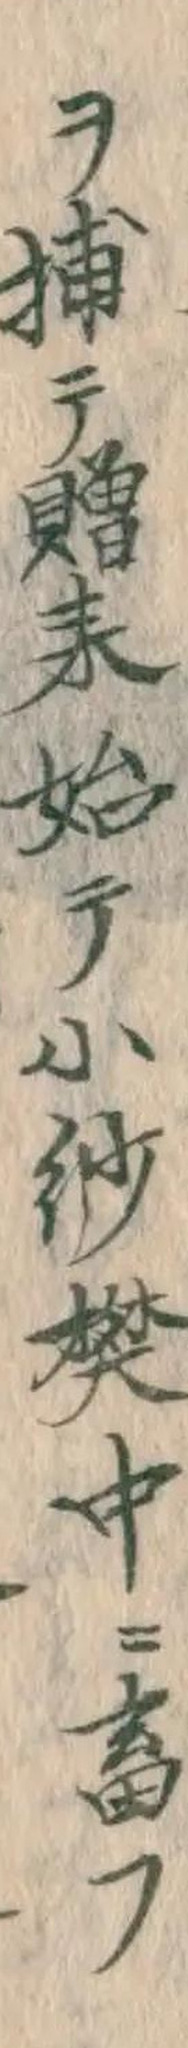ヲ捕テ贈来始テ小紗焚中ニ畜フ
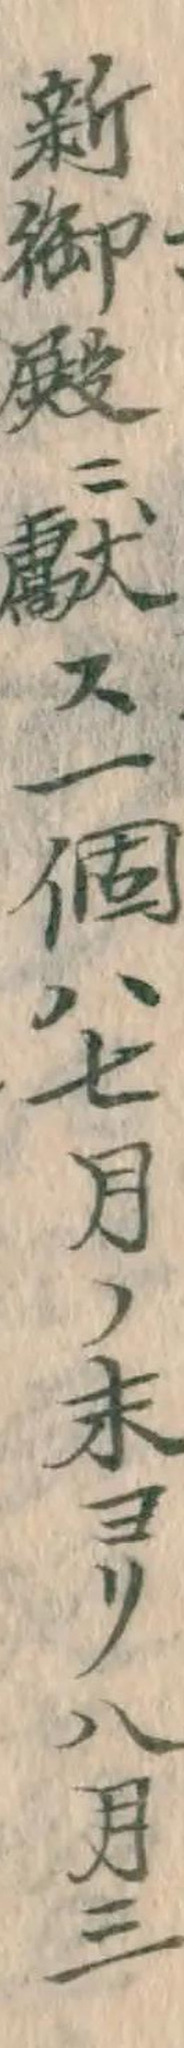新御殿ニ献ス一個ハ七月ノ末ヨリ八月三
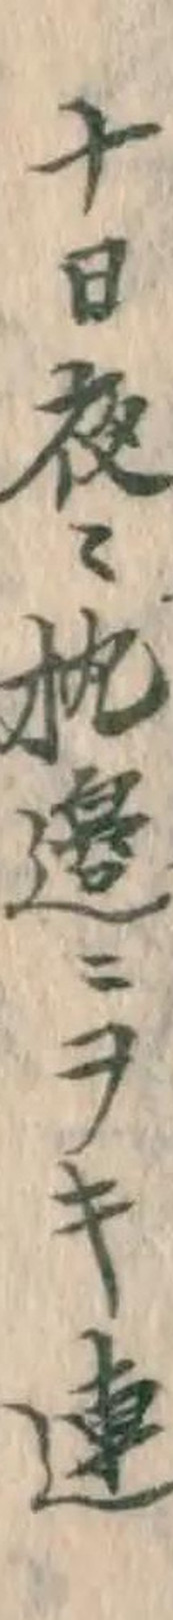十日夜々枕邊ニヲキ連
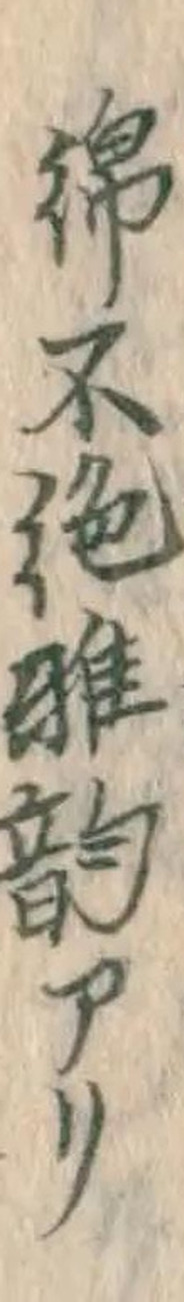綿不絶雅韵アリ
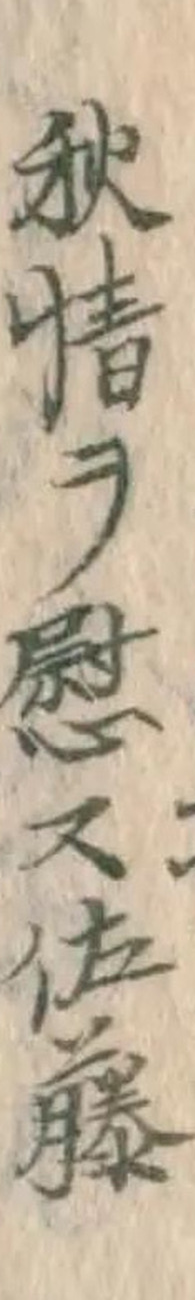秋情ヲ慰ス佐藤
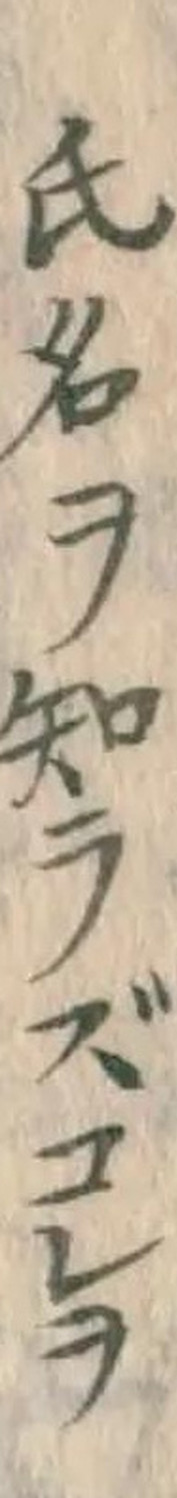氏名ヲ知ラズコレヲ
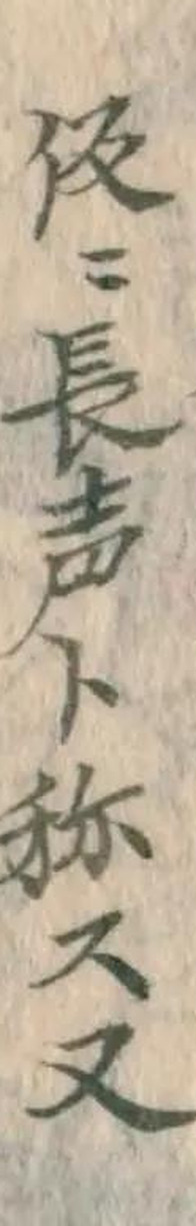仮ニ長声ト称ス又
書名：千蟲譜 3巻. [3]
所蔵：国立国会図書館 National Diet Library, JAPAN
